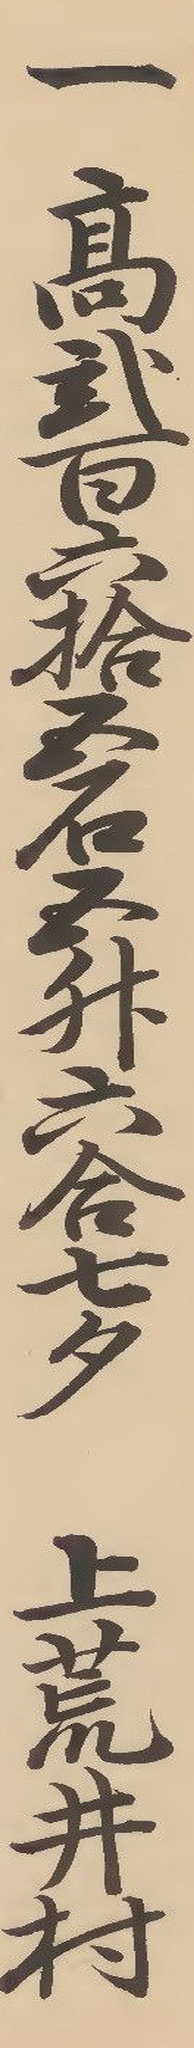一高弐百六拾五石五升六合七勺上荒井村
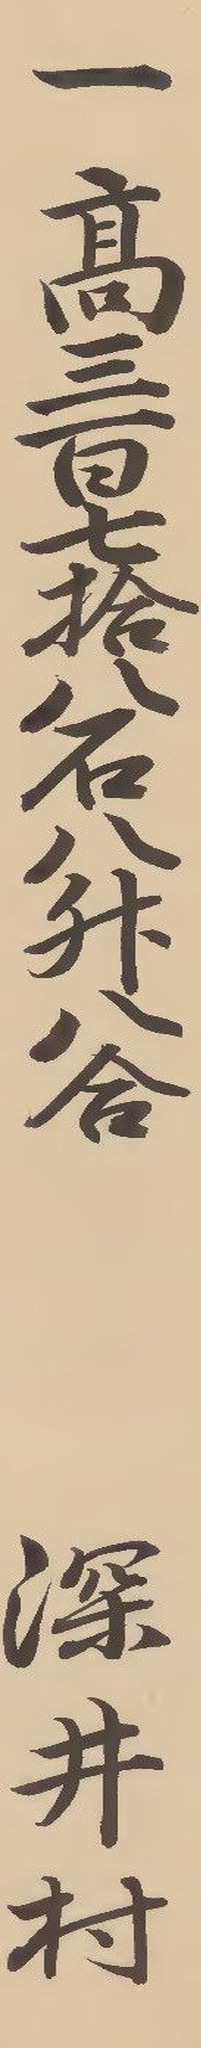一高三百七拾八石八升八合深井村
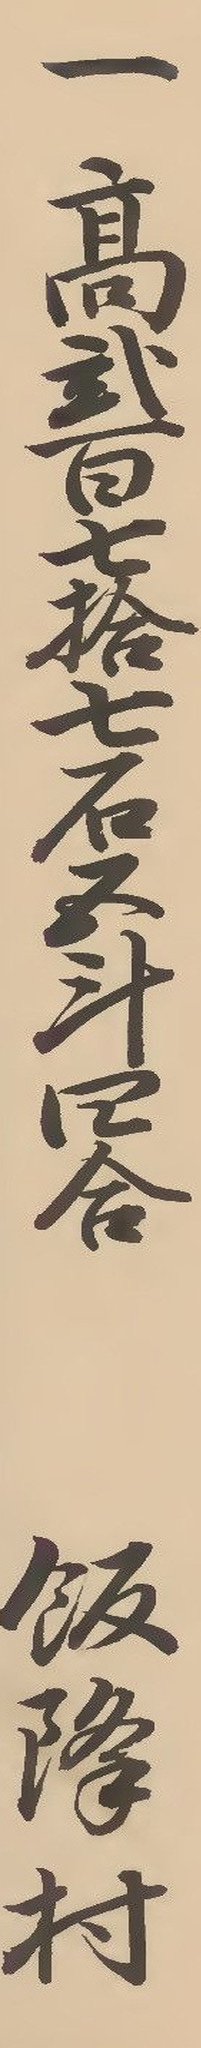一高弐百七拾七石五斗四合飯降村
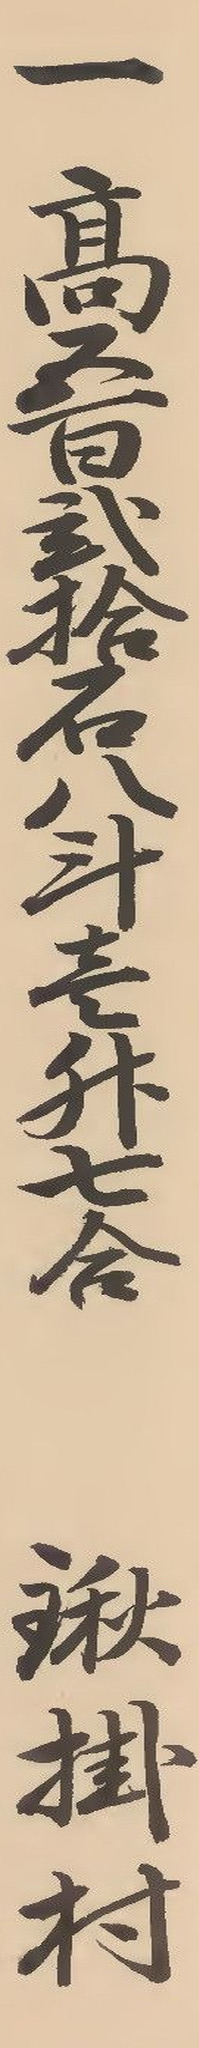一高五百弐拾石八斗壱升七合鍬掛村
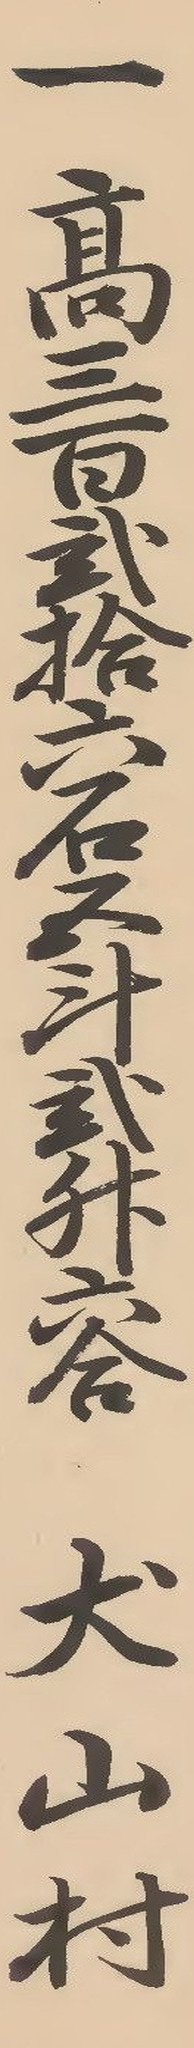一高三百弐拾六石五斗弐升六合犬山村
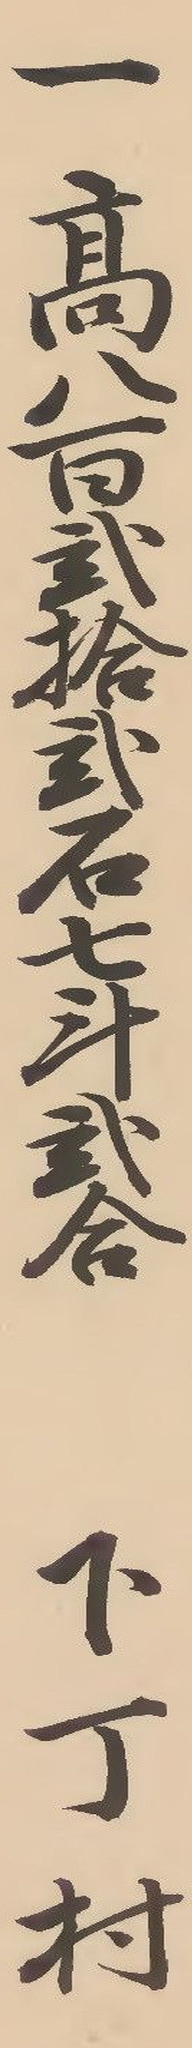一高八百弐拾弐石七斗弐合下丁村
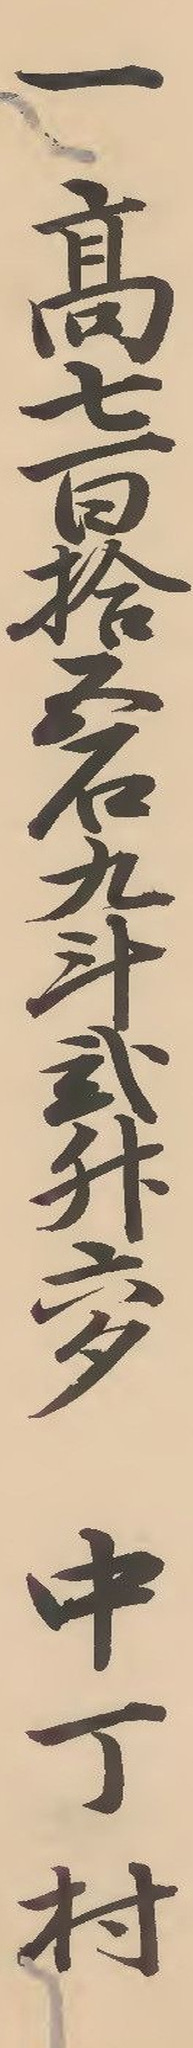一高七百拾五石九斗弐升六勺中丁村

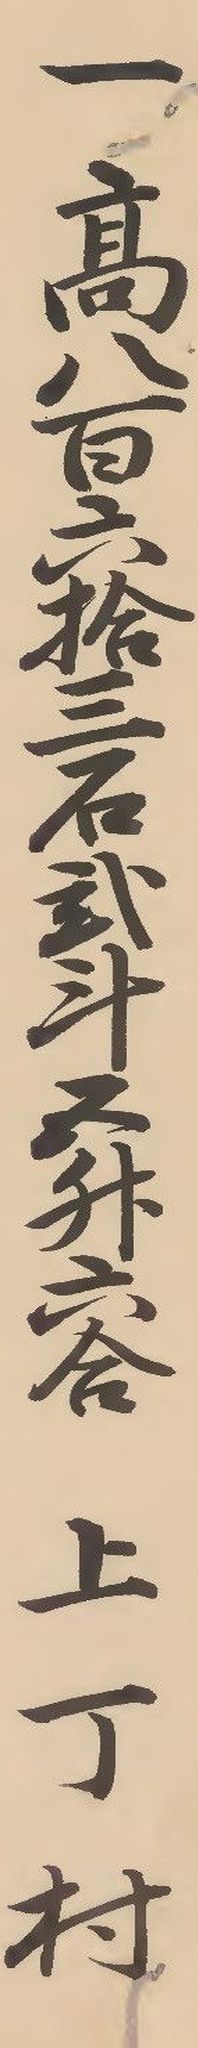一高八百六拾三石弐斗五升六合上丁村
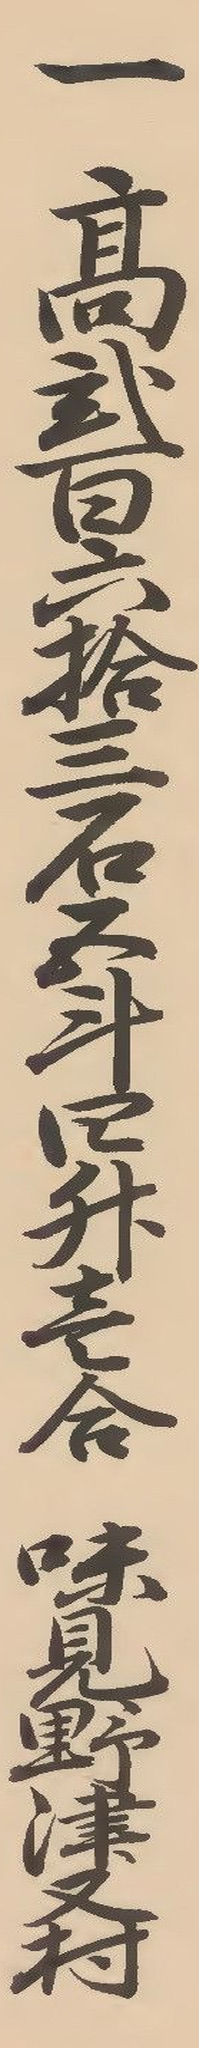一高弐百六拾三石五斗四升壱合味見野津又村
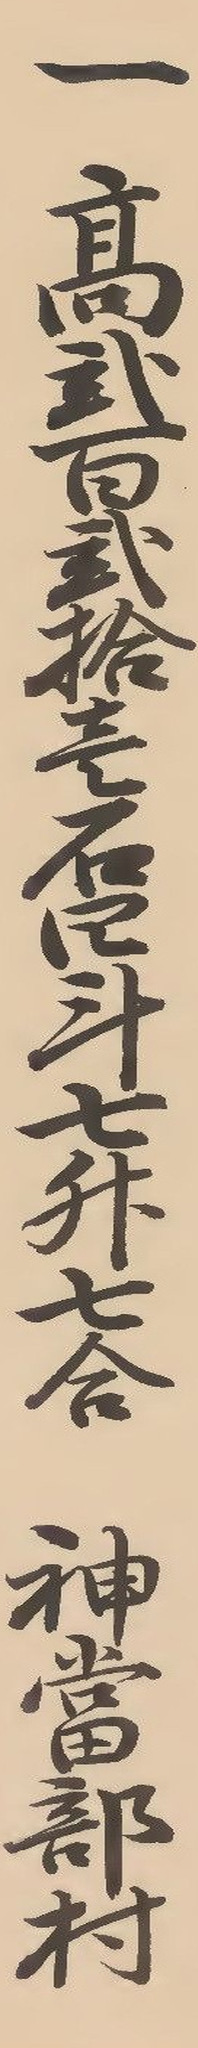一高弐百弐拾壱石四斗七升七合神当部村
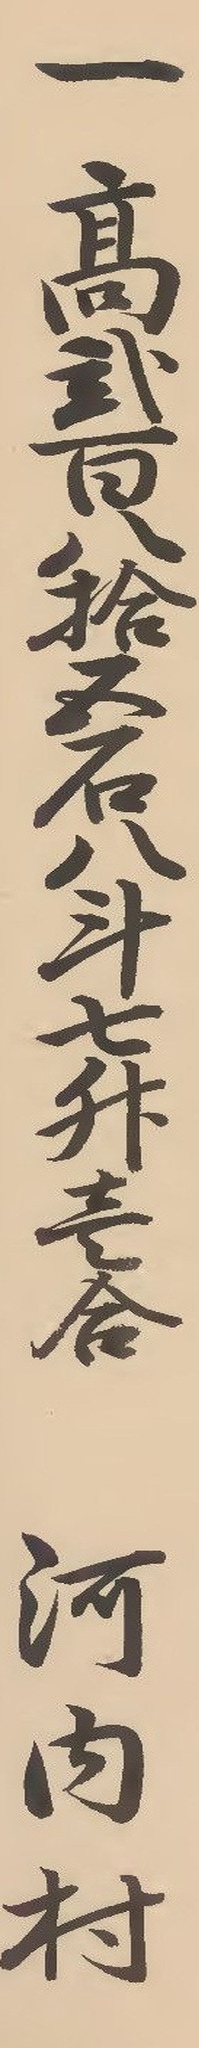一高弐百八拾五石八斗七升壱合河内村
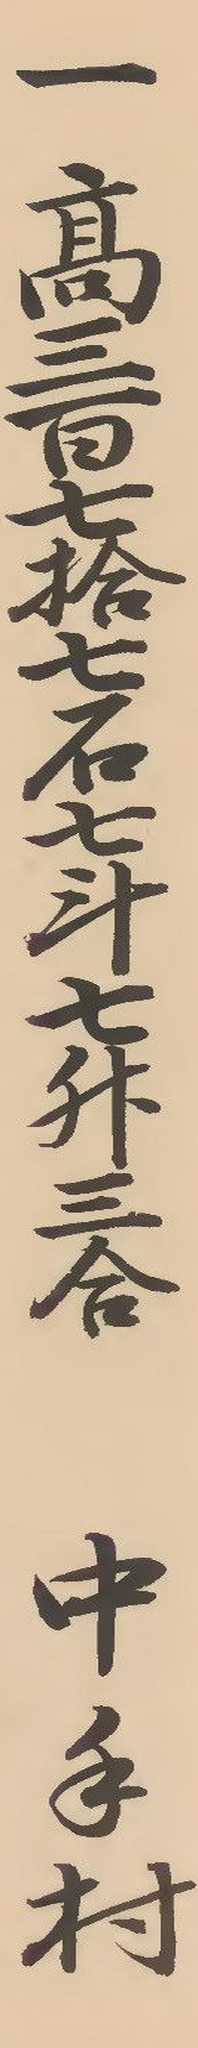一高三百七拾七石七斗七升三合中手村
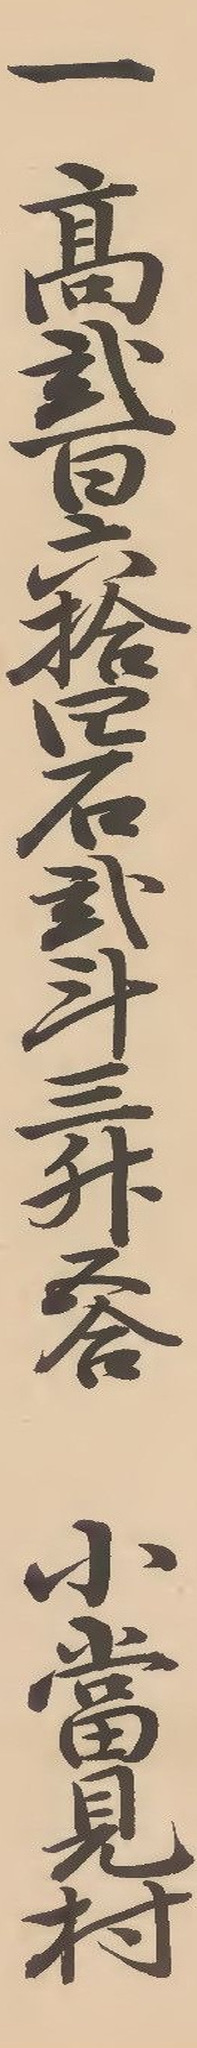一高弐百六拾四石弐斗三升五合小当見村
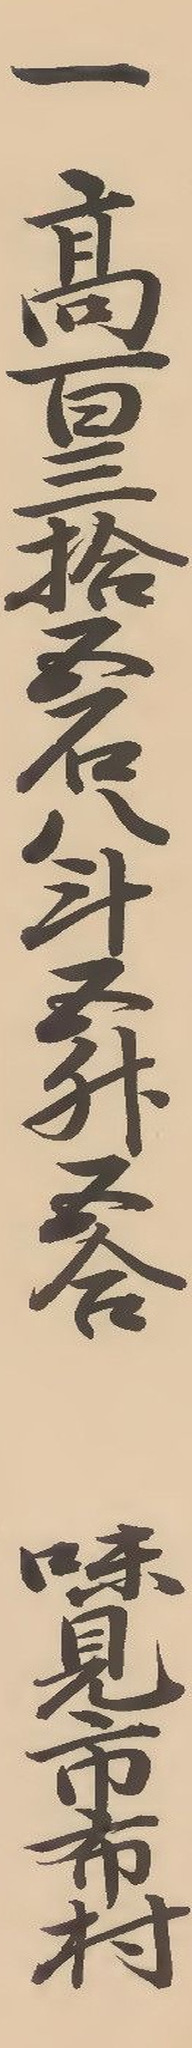一高百三拾五石八斗五升五合味見市布村
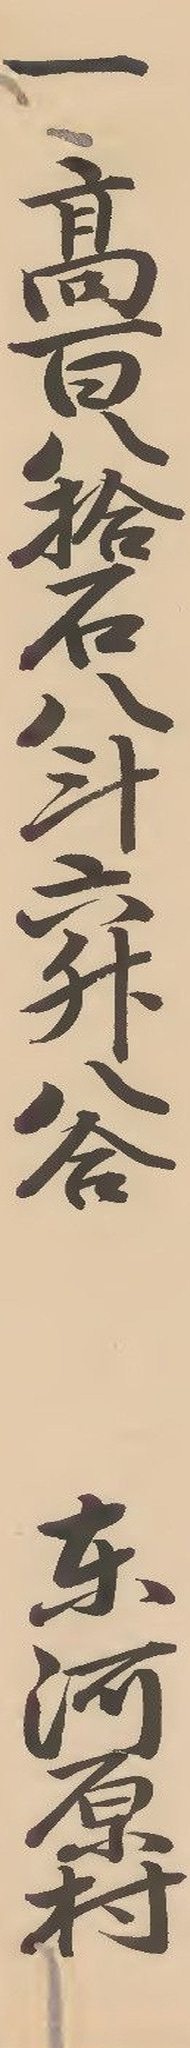一高百八拾石八斗六升八合東河原村

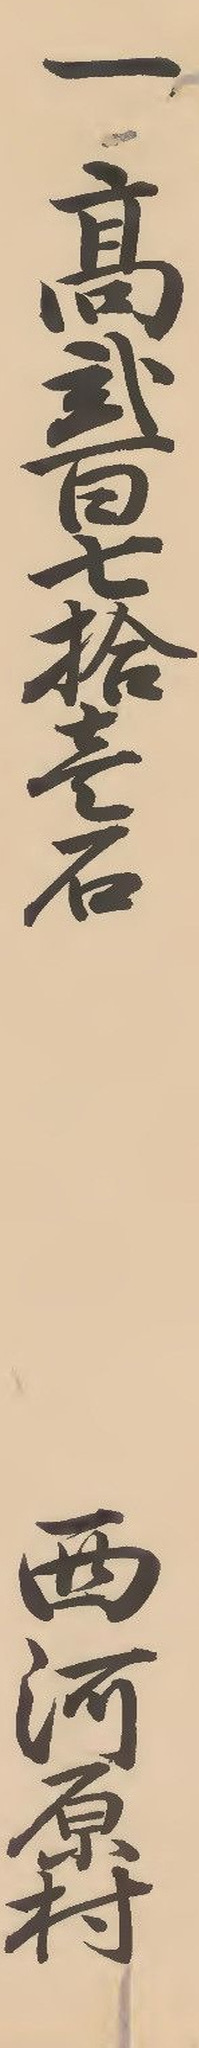一高弐百七拾壱石西河原村
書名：越前国郷帳
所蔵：国立公文書館 National Archives of Japan
